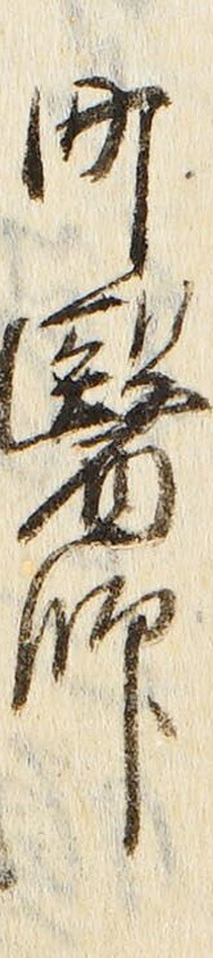町医師
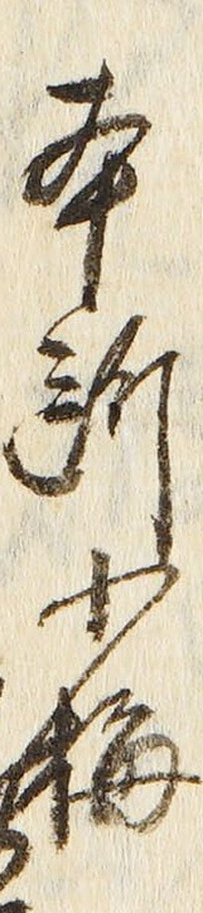本所小梅
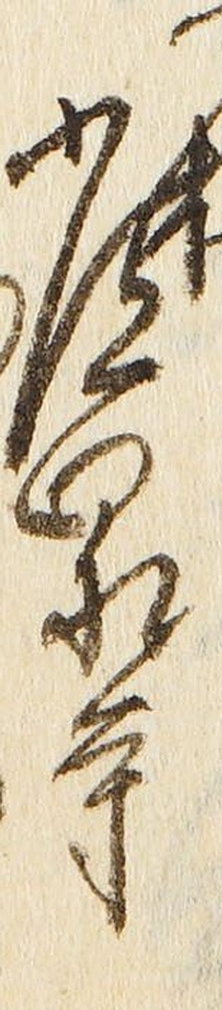常泉寺
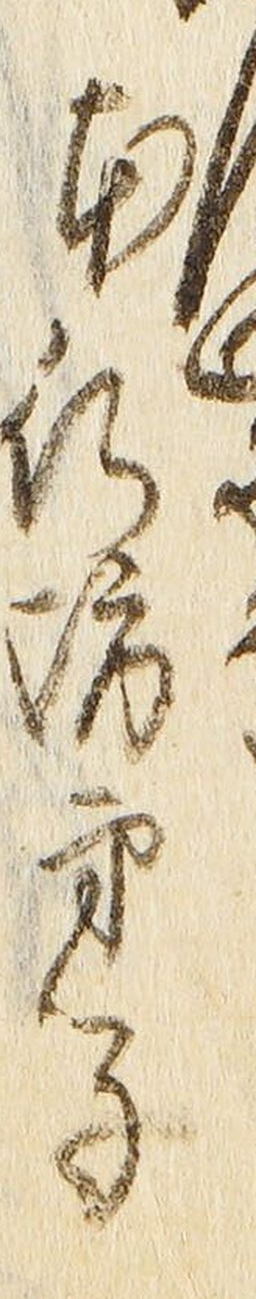本役坊弟子
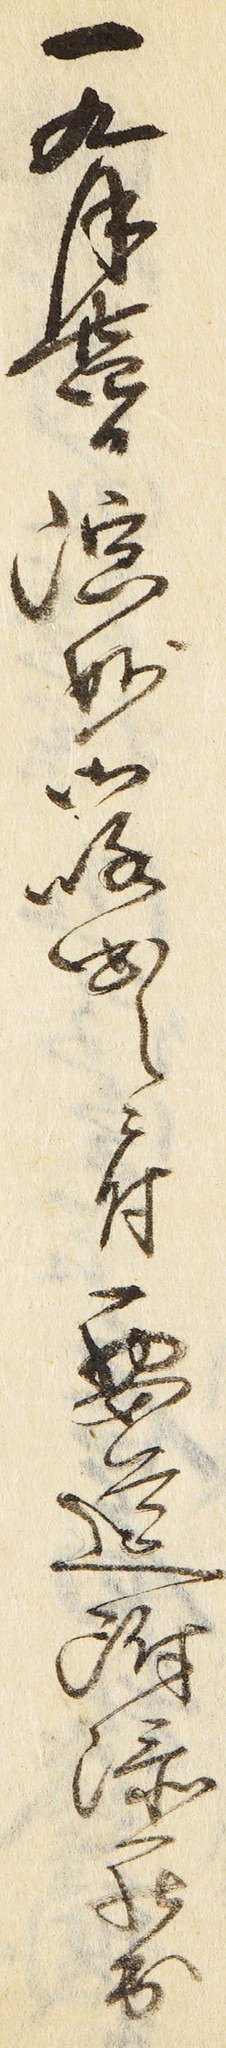一九月廿四日演妙御呼出しに付要遵附添罷出
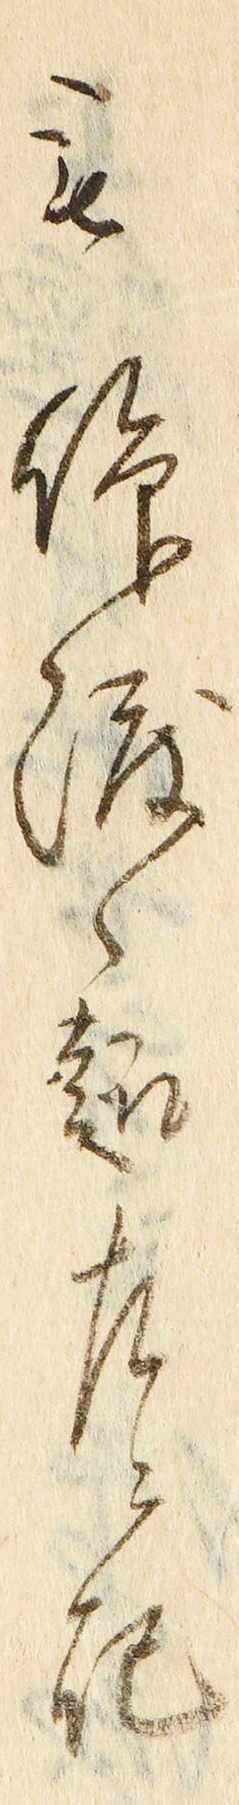被仰渡候趣左に記
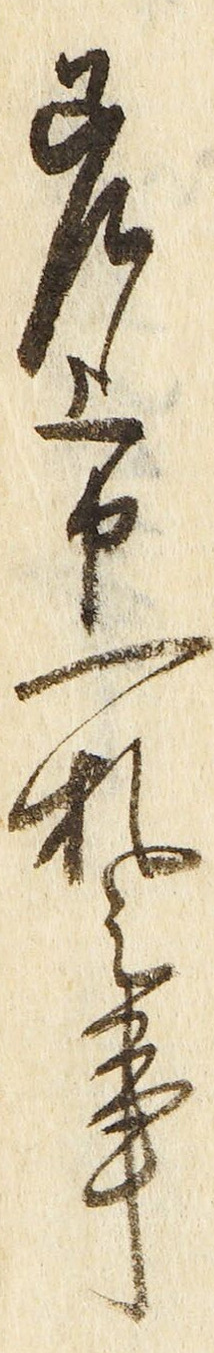差上申一札之事

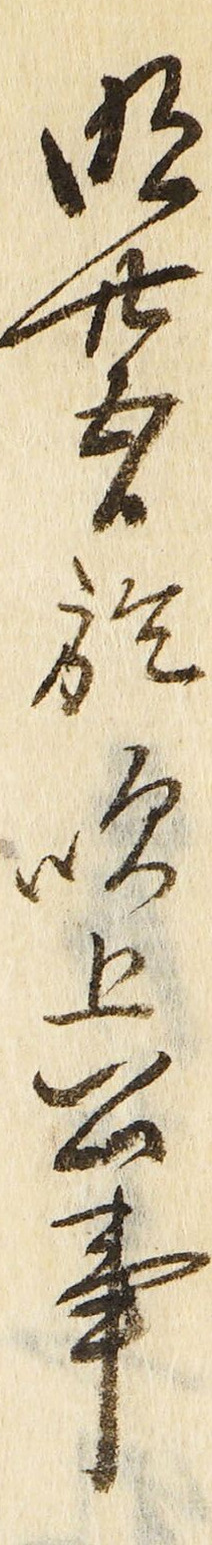明廿五日於吹上公事
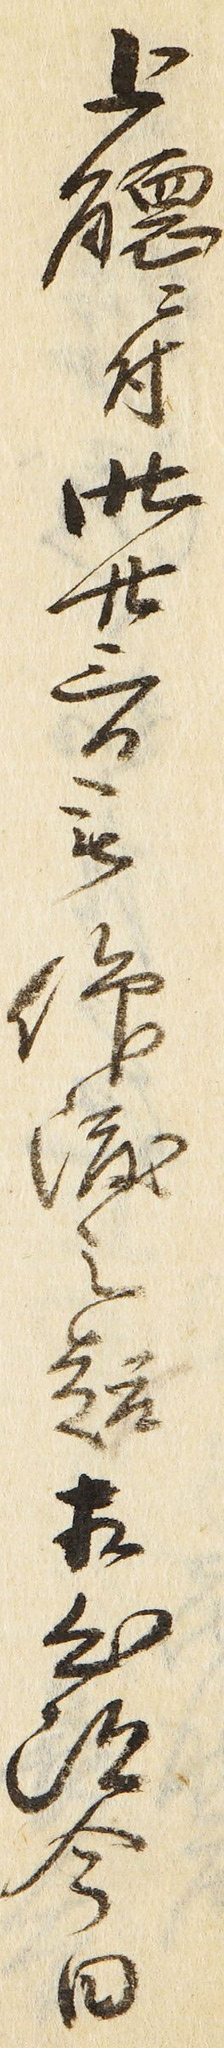上聴に付昨廿三日被仰渡之趣相心得今日
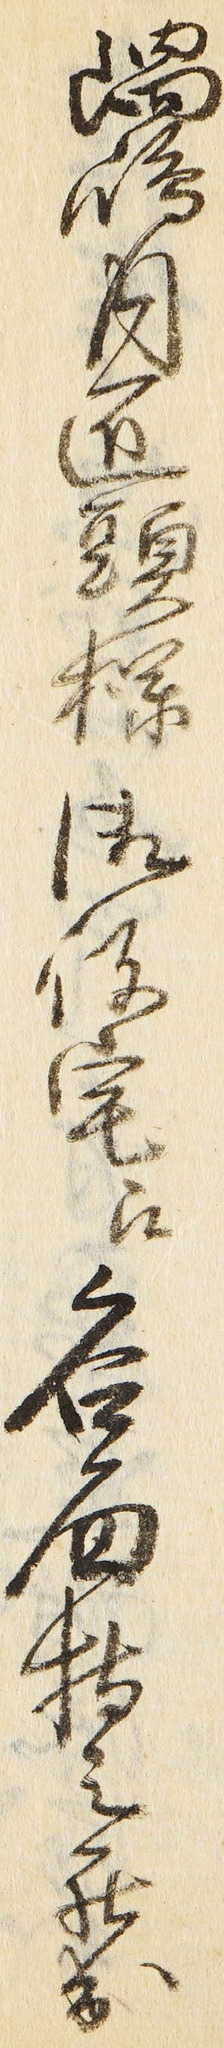鍋嶋内匠頭様御役宅江名面持之罷出
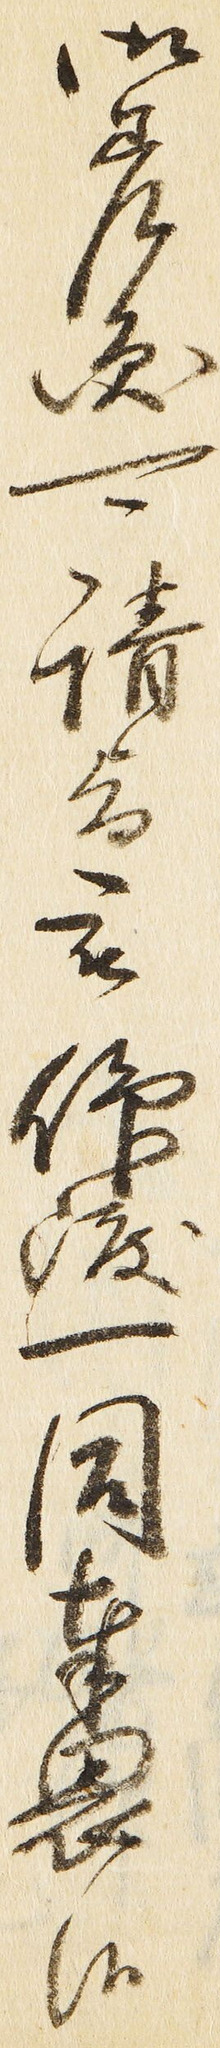御差図可請旨被仰渡一同奉畏候
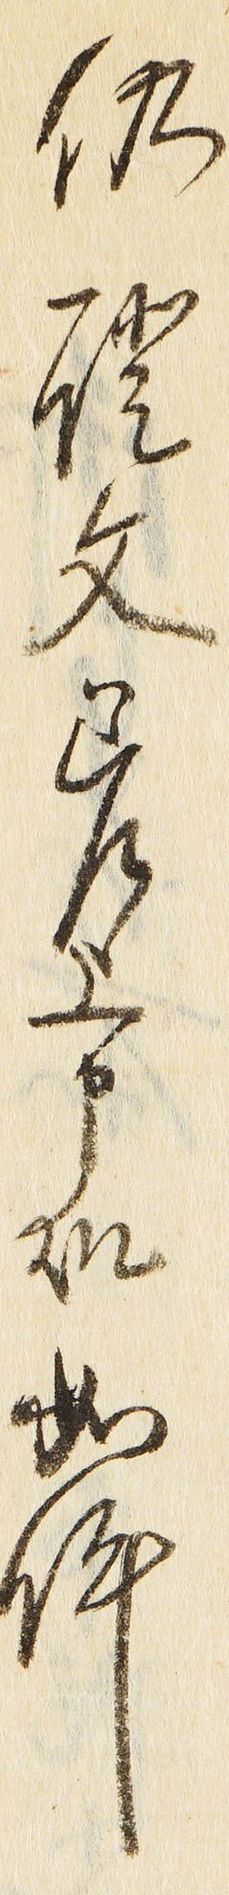仍證文差上申処如件
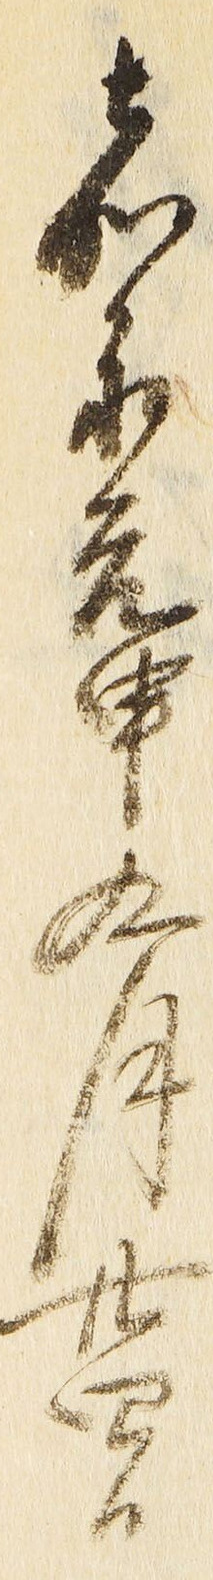嘉永元申九月廿四日
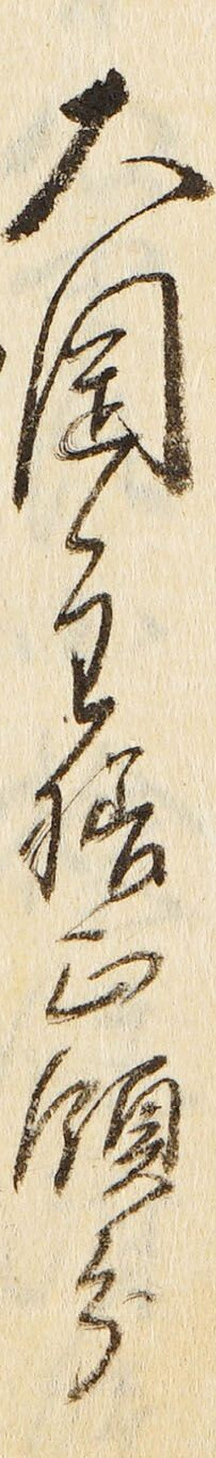大岡主膳正領分
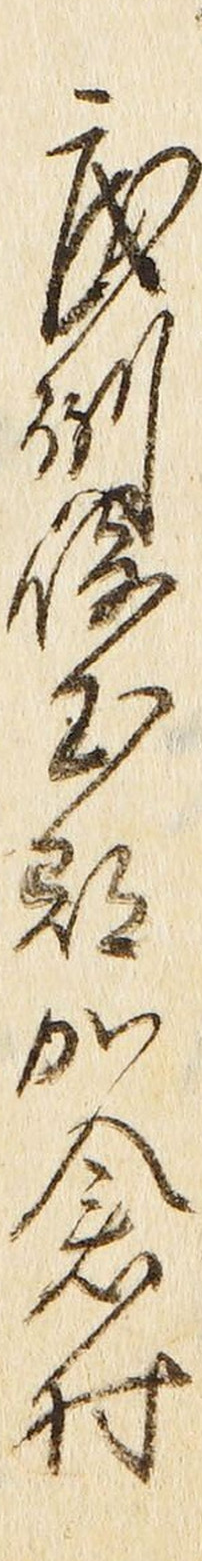武州崎玉郡加倉村
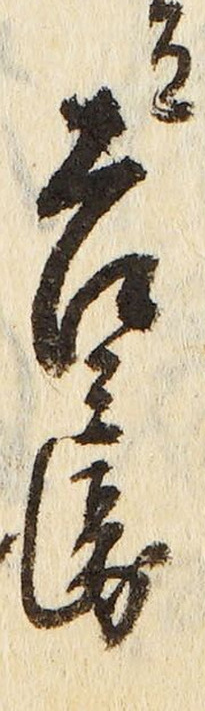吉兵衛
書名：異流一件日記
